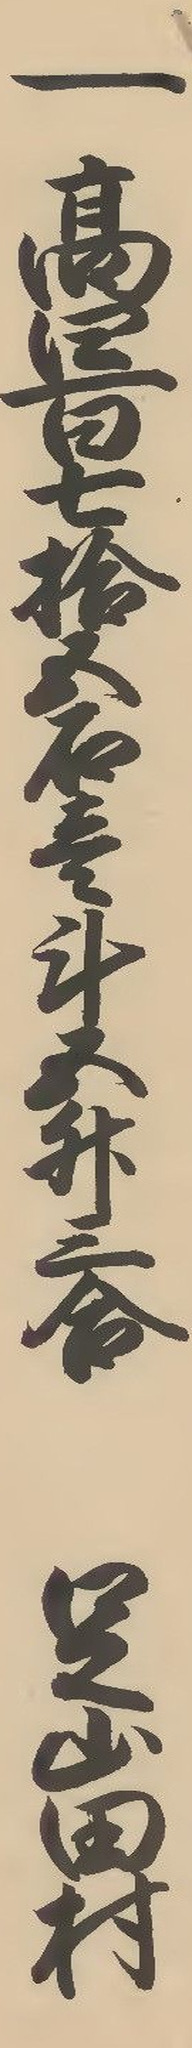一高四百七拾五石壱斗五升三合足山田村

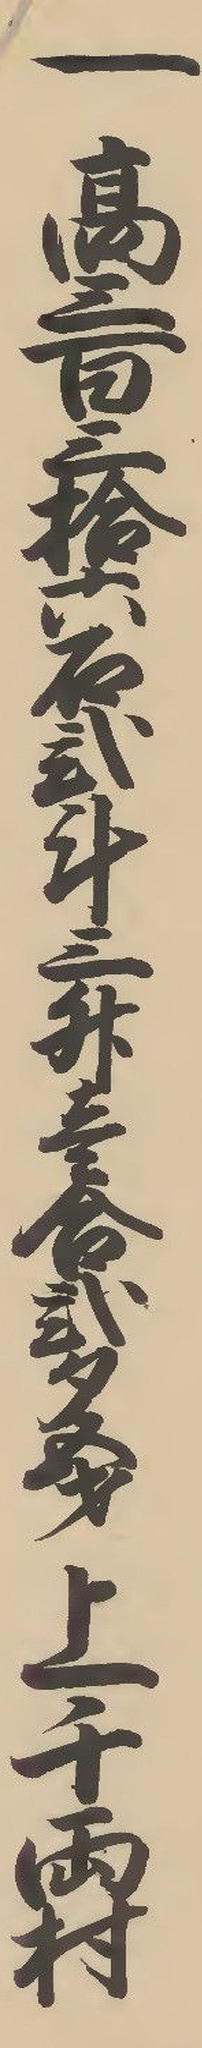一高三百三拾六石弐斗三升壱合弐勺五才上千両村
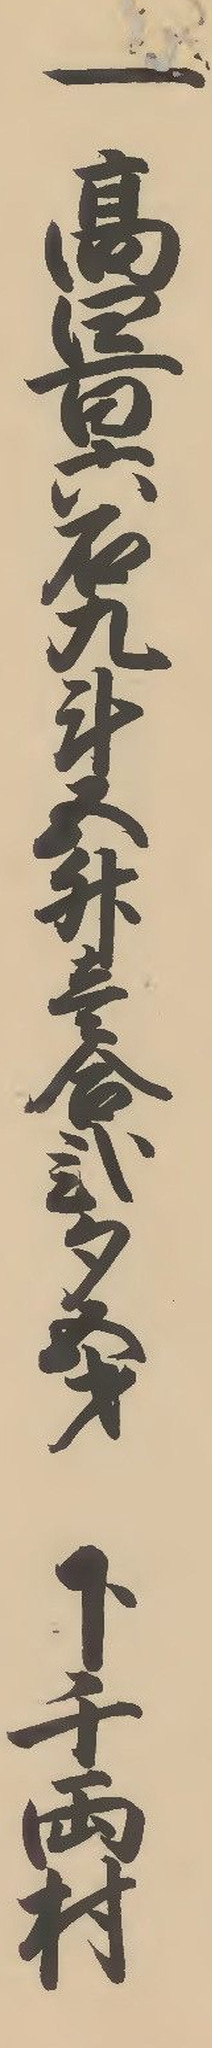一高四百六石九斗五升壱合弐勺五才下千両村
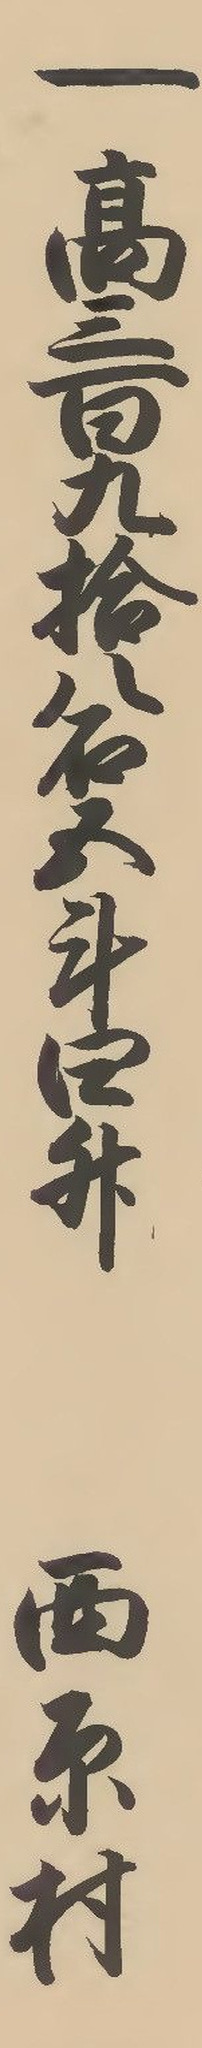一高三百九拾八石五斗四升西原村
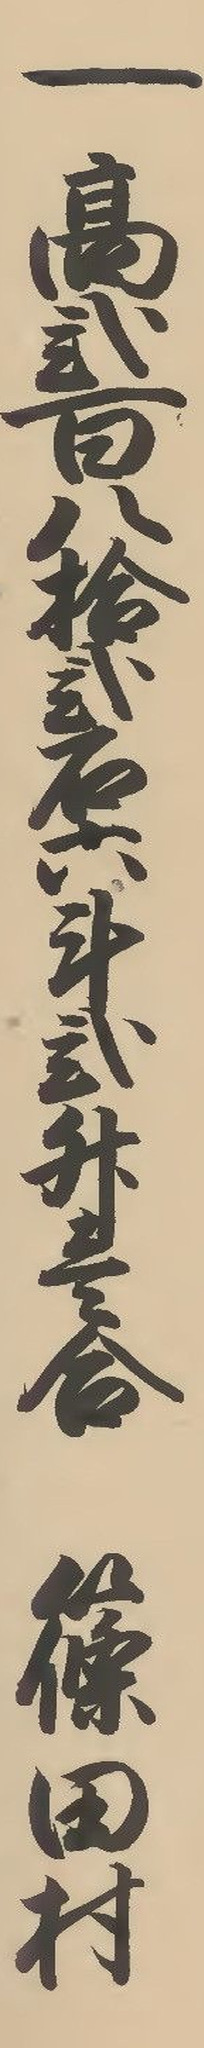一高弐百八拾弐石六斗弐升壱合篠田村
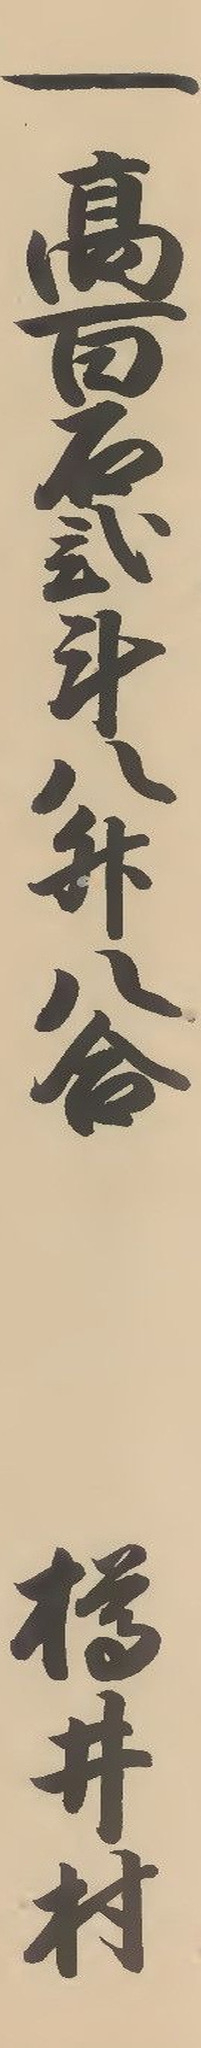一高百石弐斗八升八合樽井村
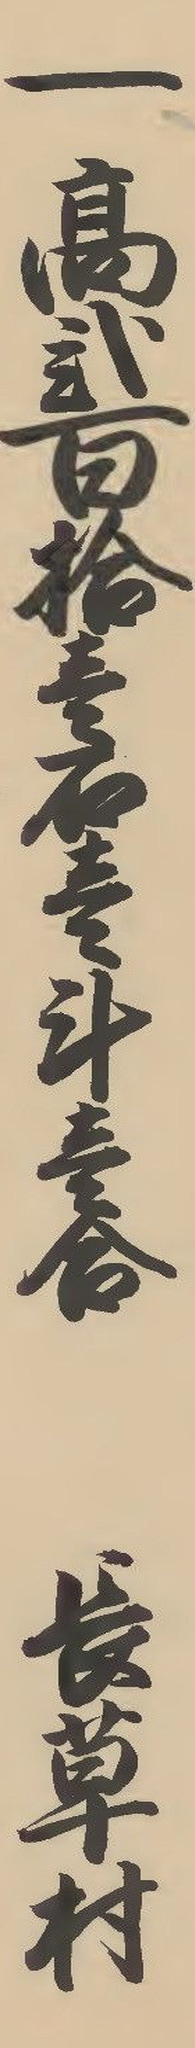一高弐百拾壱石壱斗壱合長草村
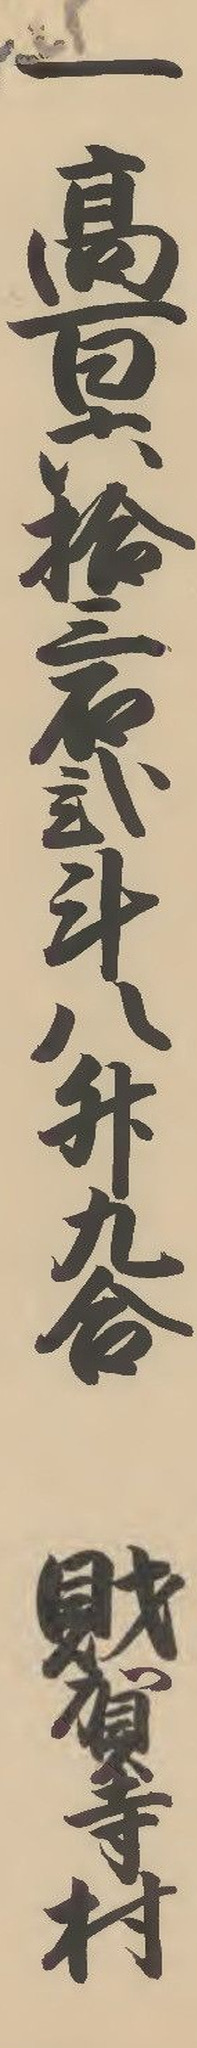一高百六拾三石弐斗八升九合財賀寺村
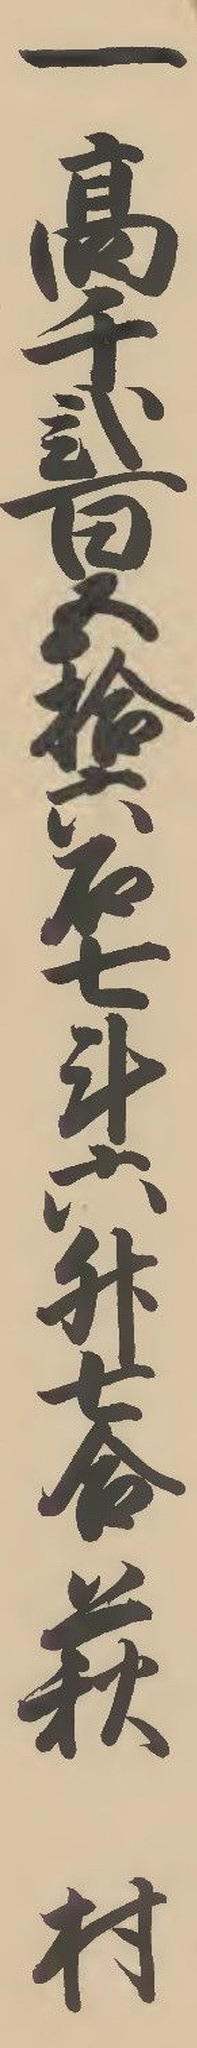一高千弐百五拾六石七斗六升七合萩村

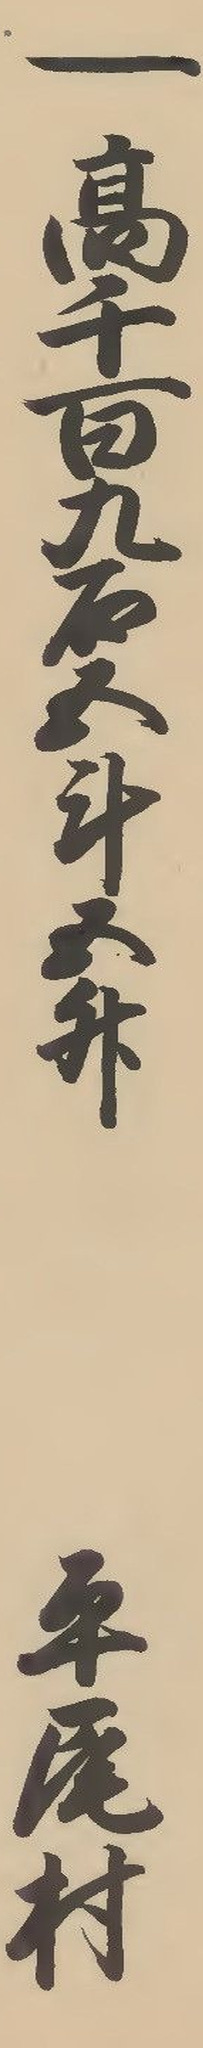一高千百九石五斗五升平尾村
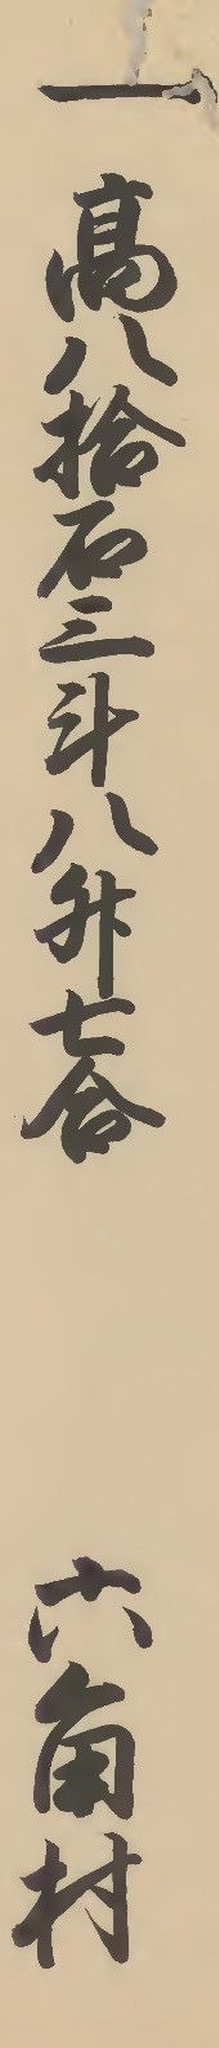一高八拾石三斗八升七合六角村
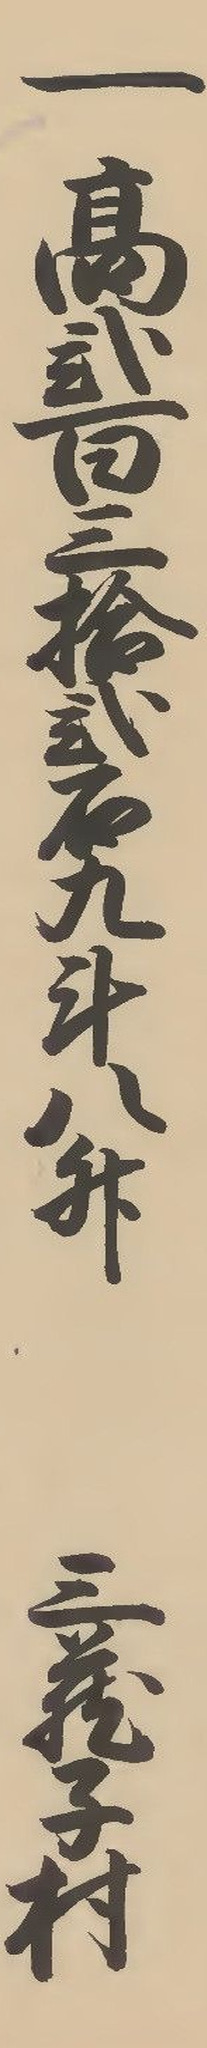一高弐百三拾弐石九斗八升三蔵子村
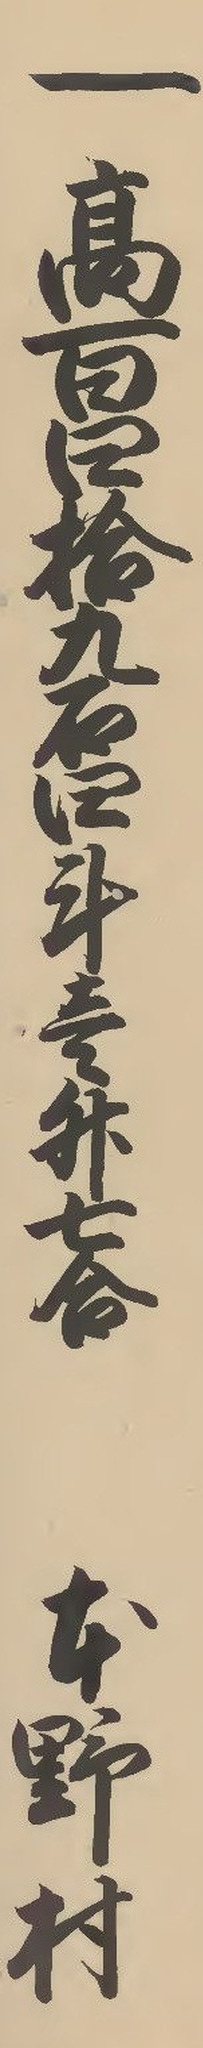一高百四拾九石四斗壱升七合本野村
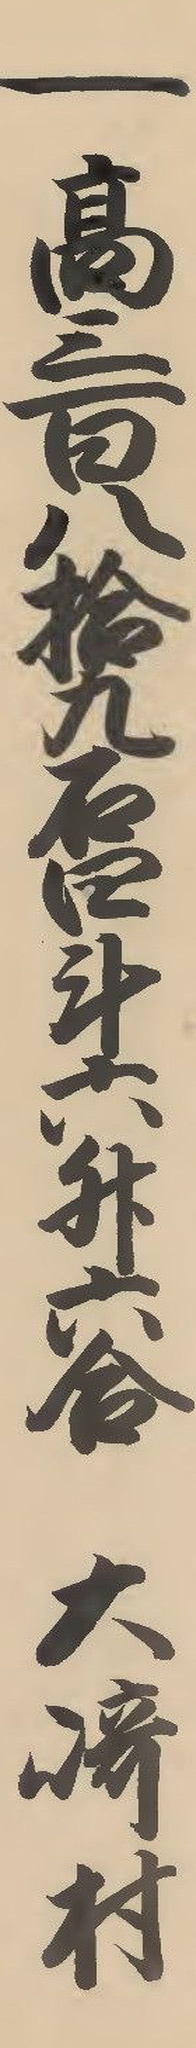一高三百八拾九石四斗六升六合大崎村
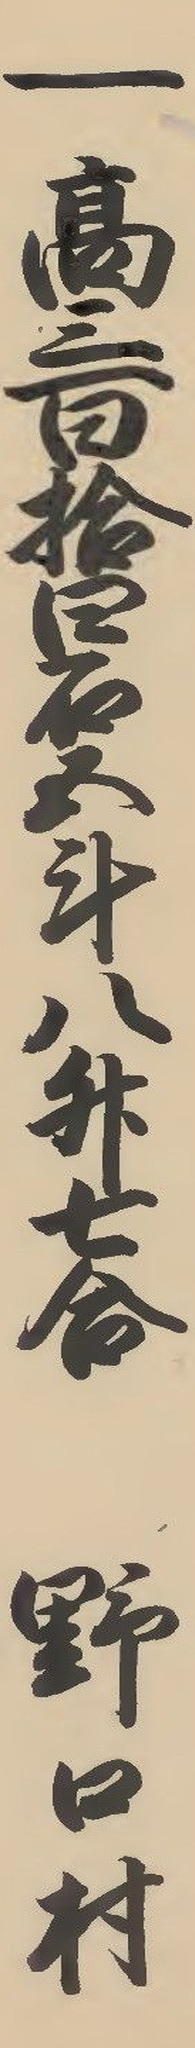一高三百拾四石五斗八升七合野口村
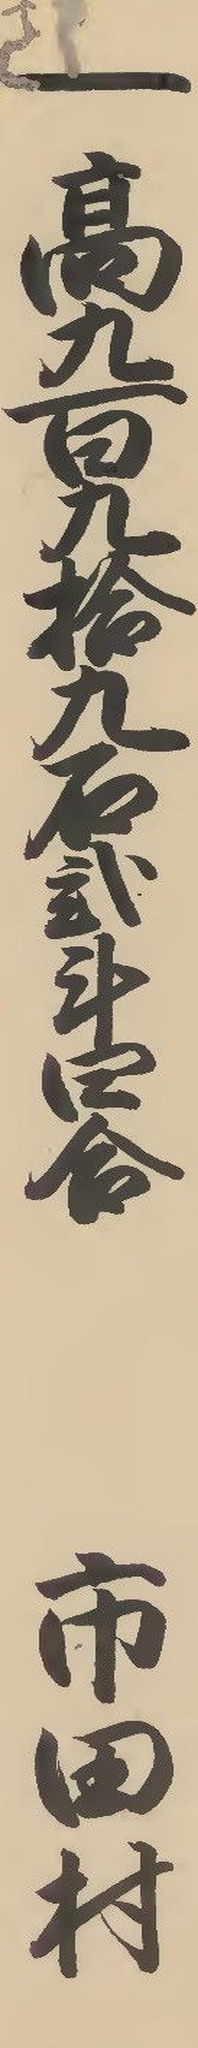一高九百九拾九石弐斗四合市田村
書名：三河国郷帳
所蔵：国立公文書館 National Archives of Japan
